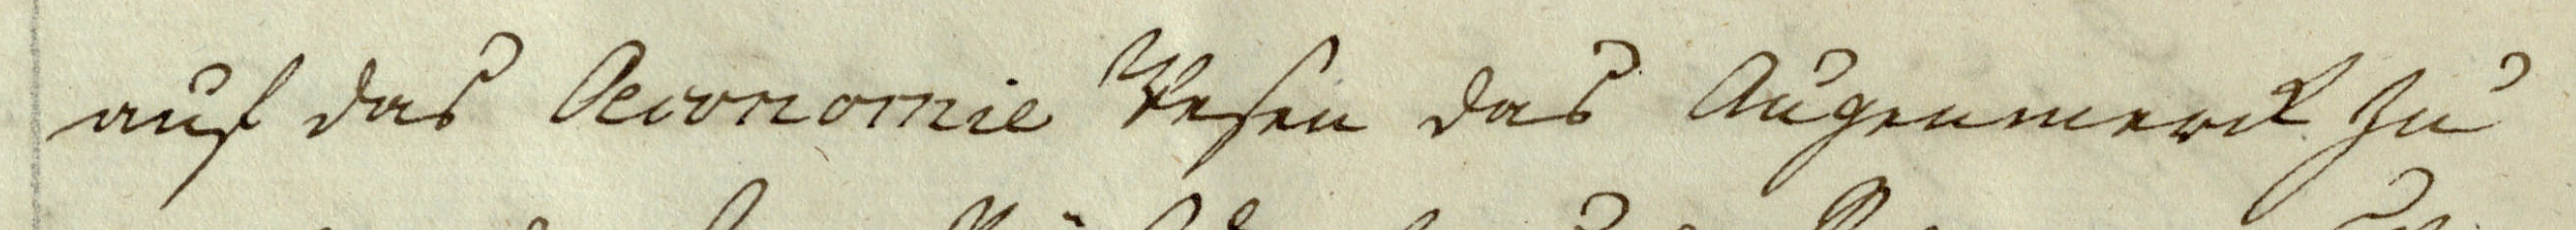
auf das Oeconomie Wesen das Augenmerk zu
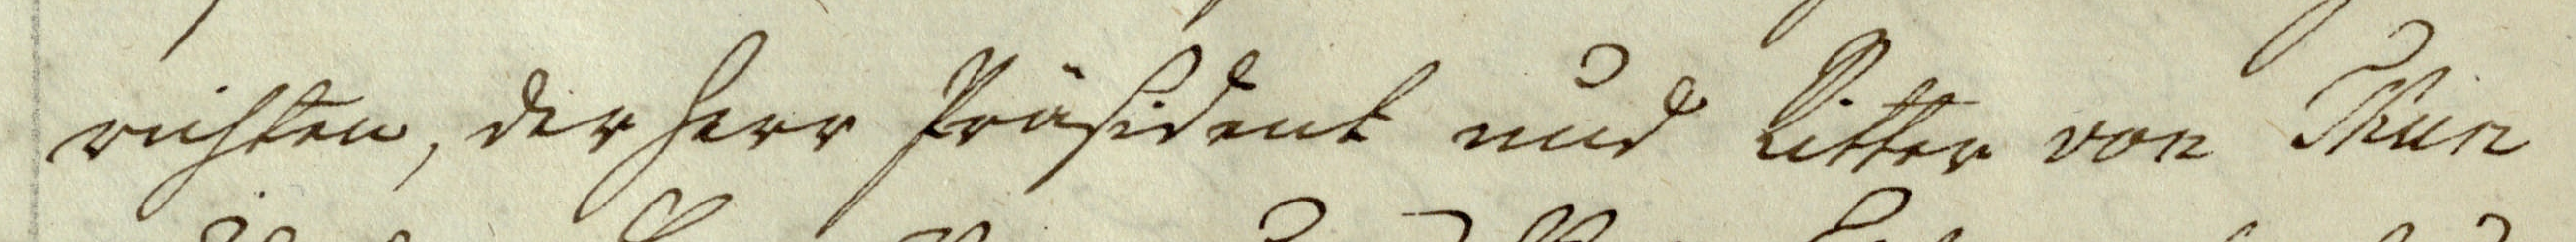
richten, der Herr Präsident und Ritter von Thun
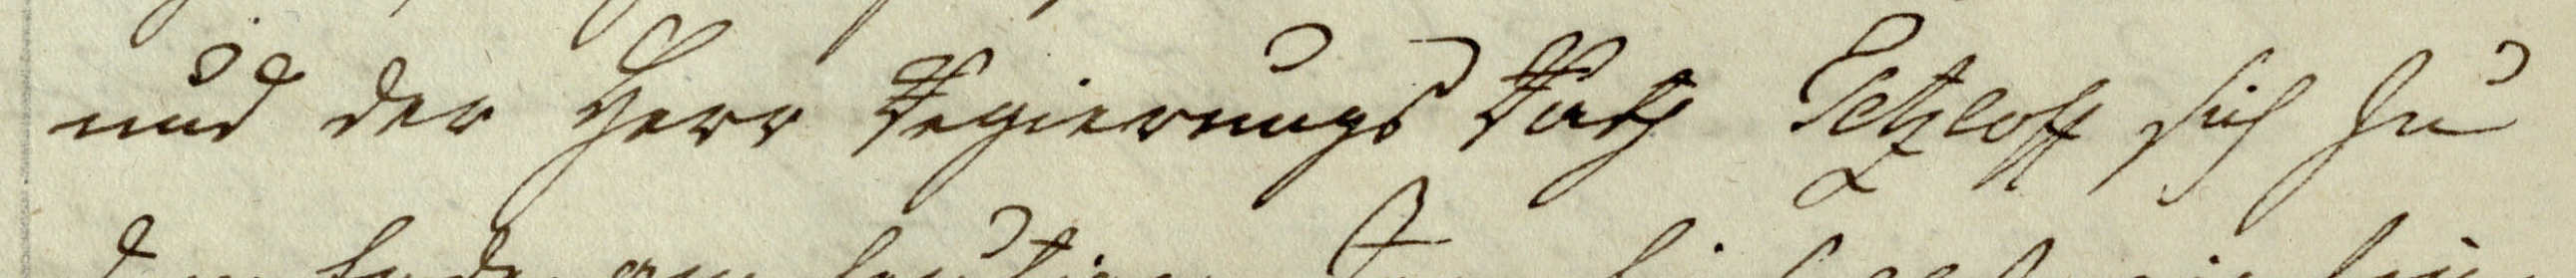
und der Herr Regierungs Rath Tetzloff sich zu
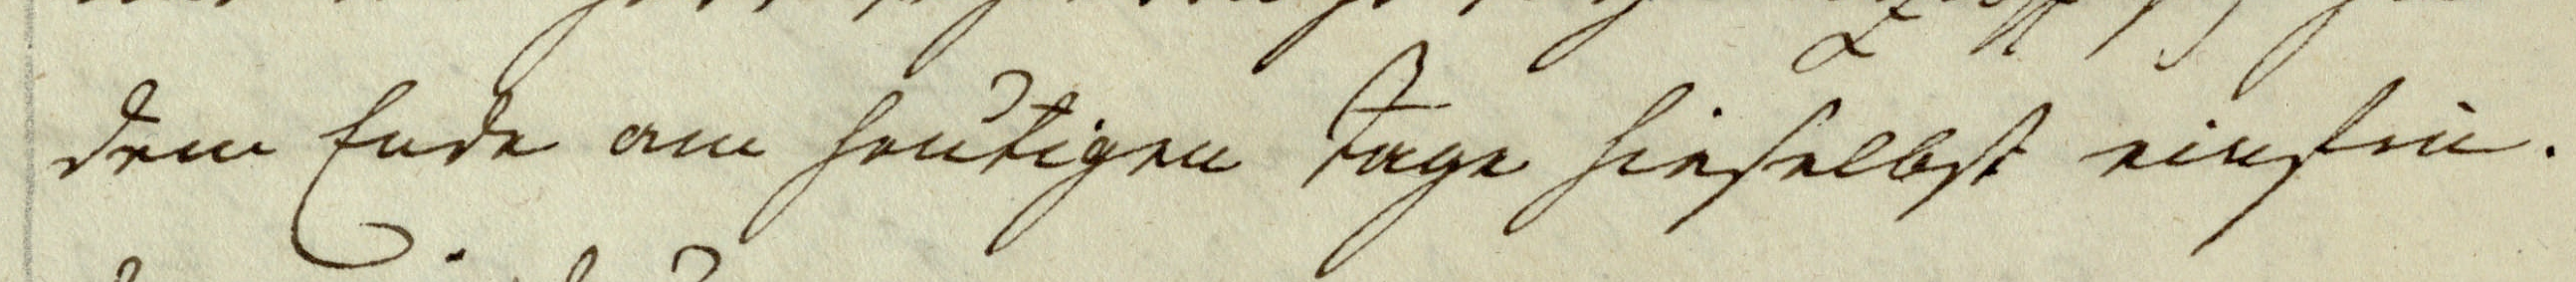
dem Ende am heutigen Tage hieselbst einfin¬
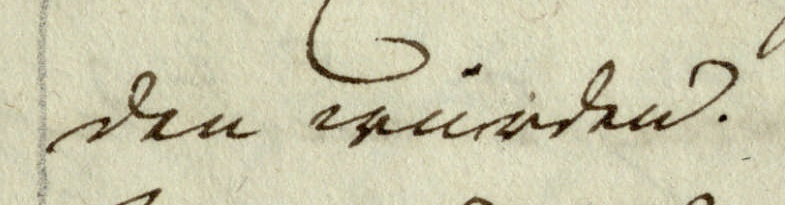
den würden.
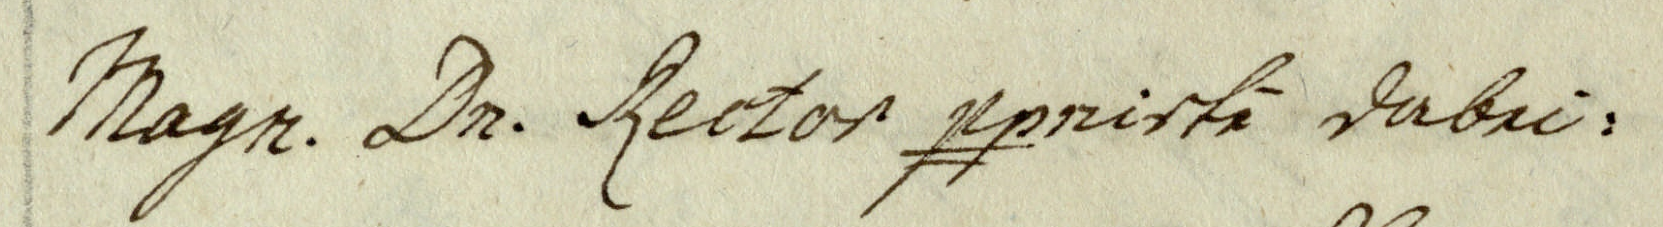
Magn. Dn. Rector ppnirte dabei:
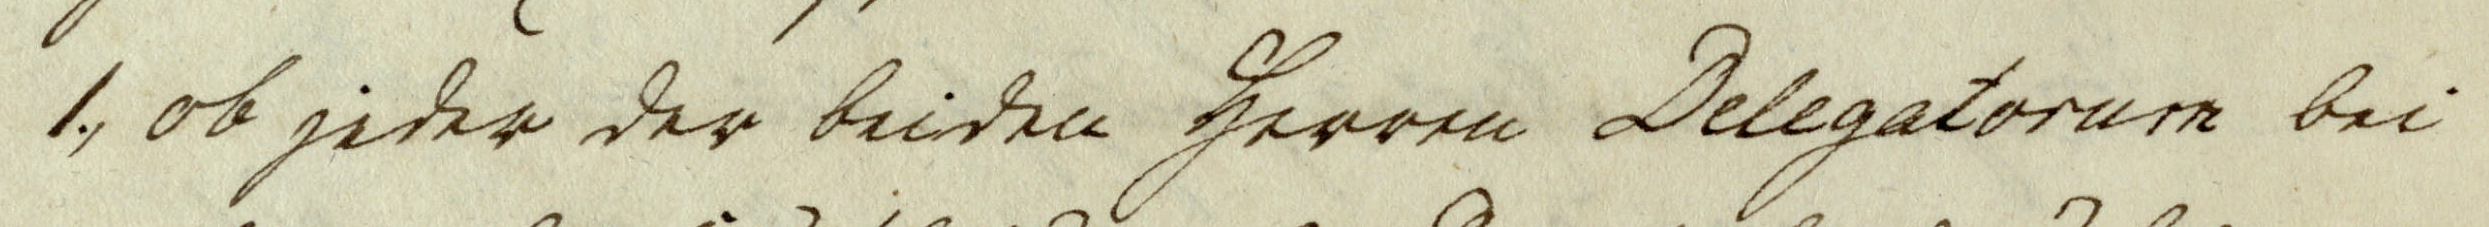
1., ob jeder der beiden Herren Delegatorum bei
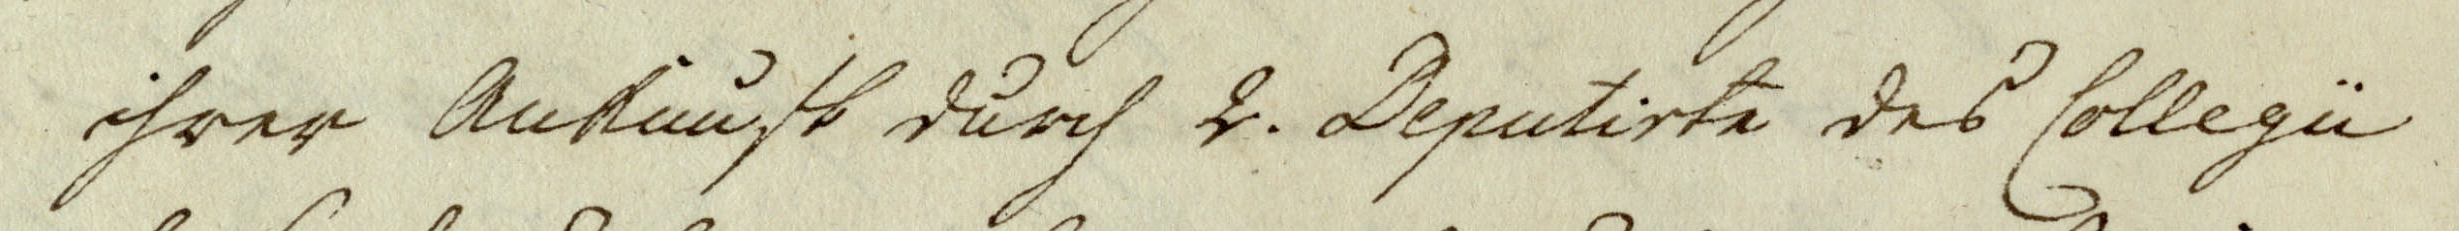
ihrer Ankunft durch 2. Deputirte des Collegii
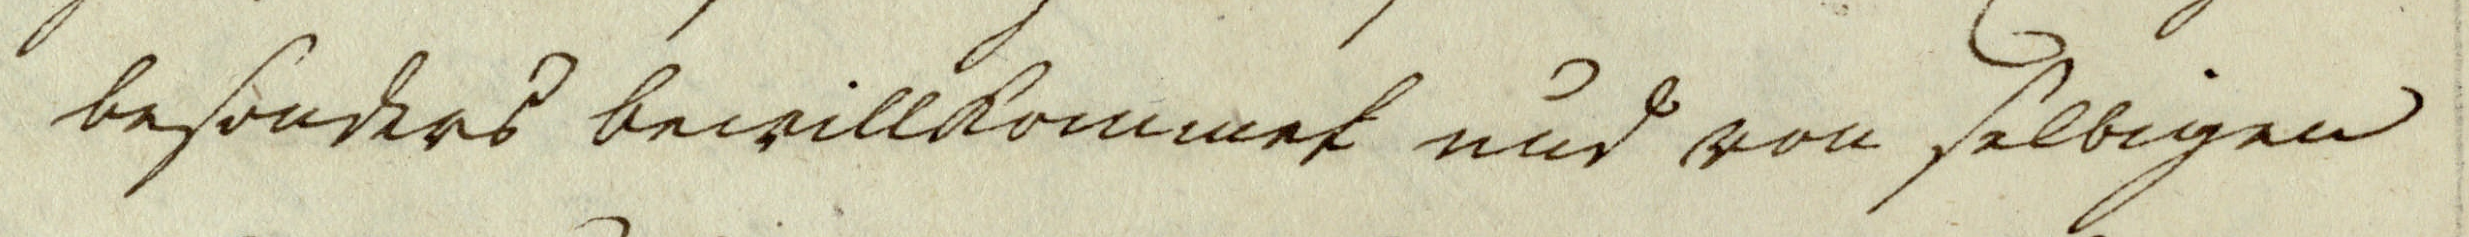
besonders bewillkommet und von selbigen
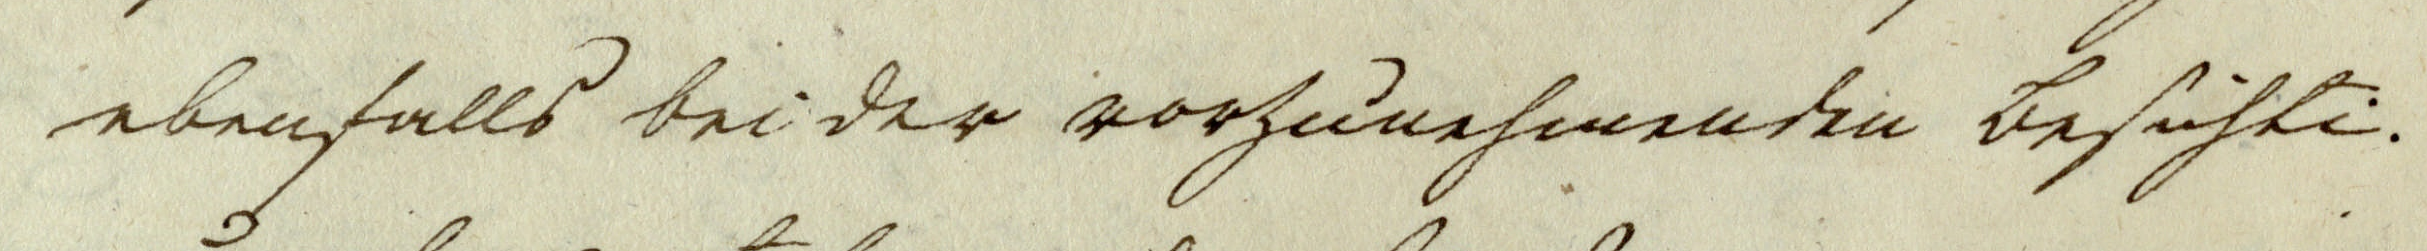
ebenfalls bei der vorzunehmenden Besichti¬
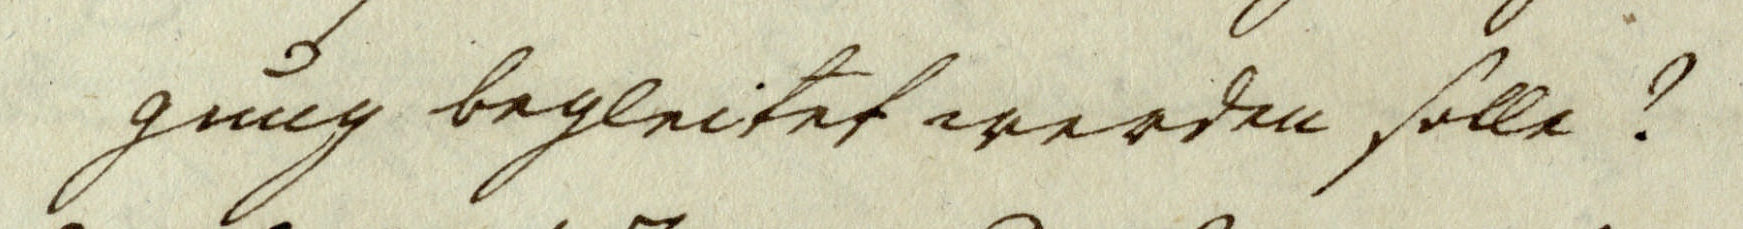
gung begleitet werden solle?
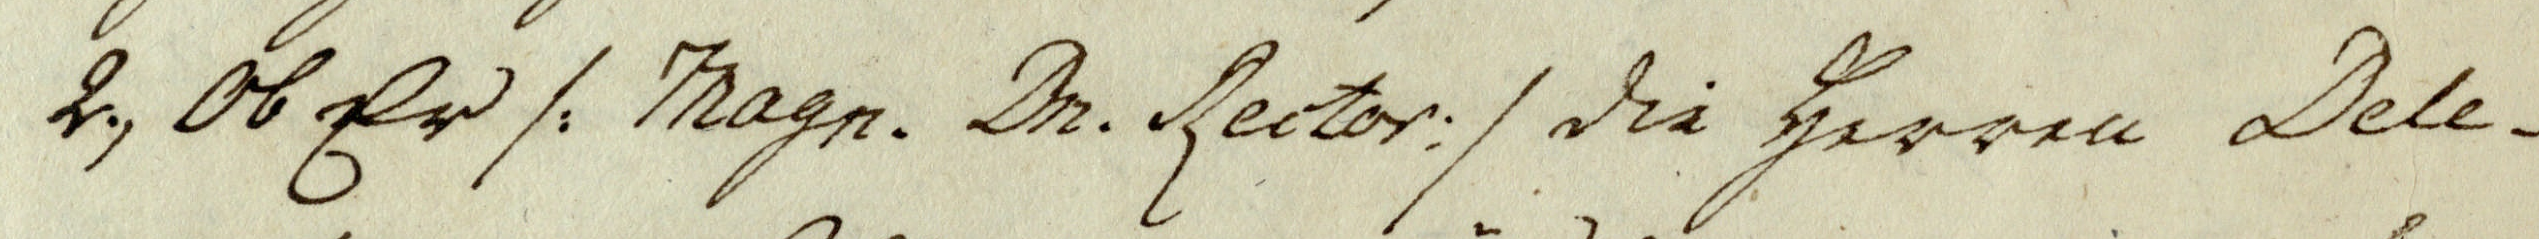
2., Ob Er /: Magn. Dn. Rector :/ die Herren Dele¬
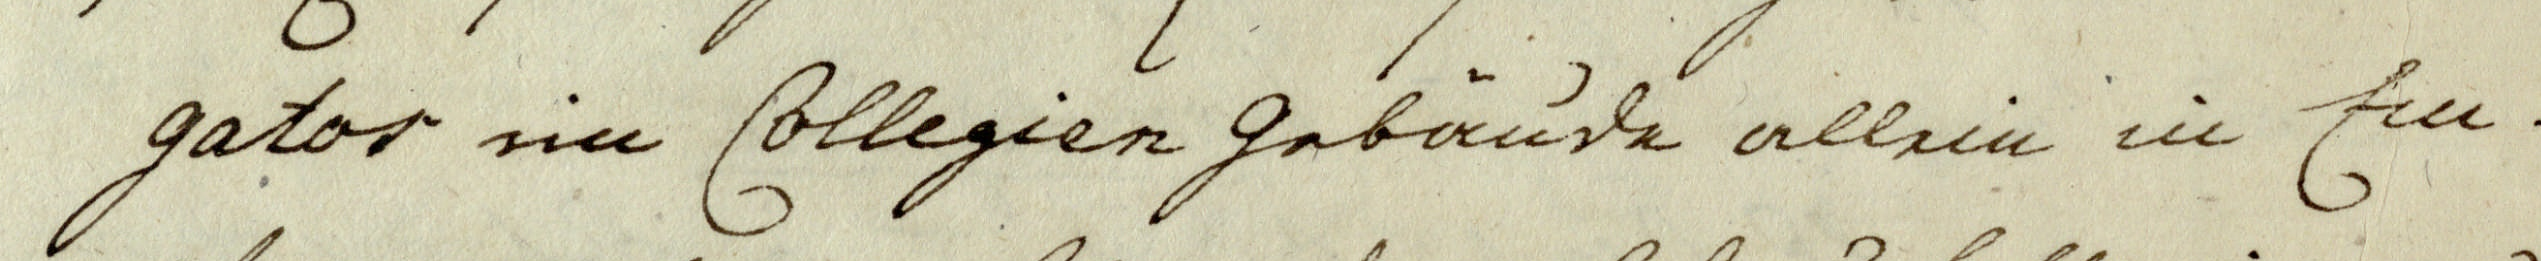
gatos im Collegien Gebäude allein in Em¬
